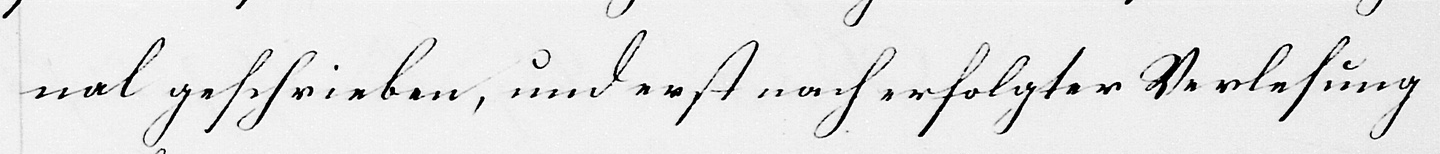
nal geschrieben, und erst nach erfolgter Verlesung
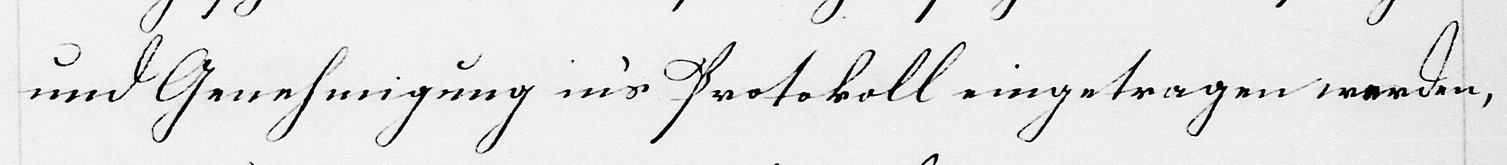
und Genehmigung in’s Protokoll eingetragen werden,
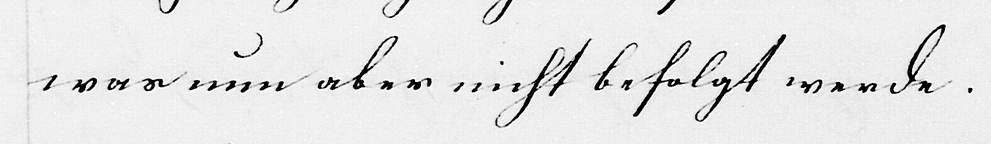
was nun aber nicht befolgt werde.
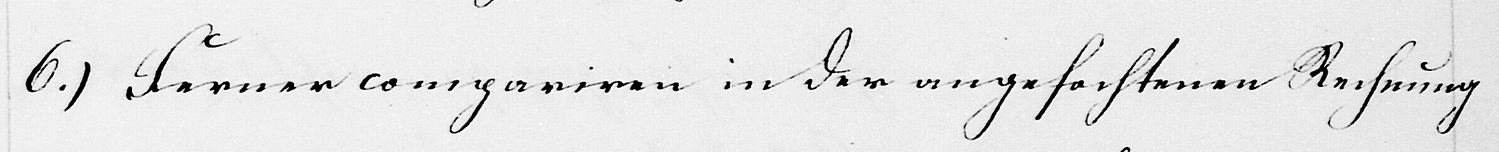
6.) Ferner compariren in der angefochtenen Rechnung
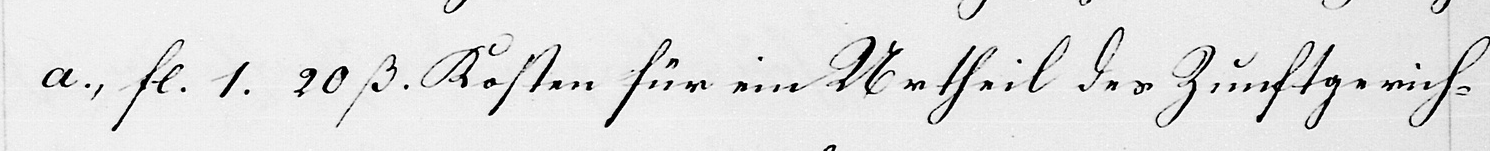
a., fl. 1. 20 ß. Kosten für ein Urtheil des Zunftgerich¬
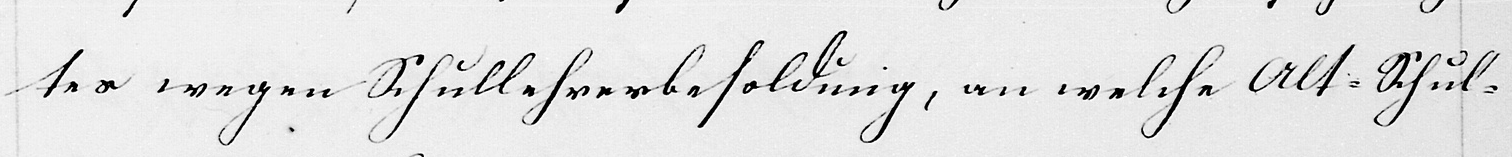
tes wegen Schullehrerbesoldung, an welche Alt-Schul¬
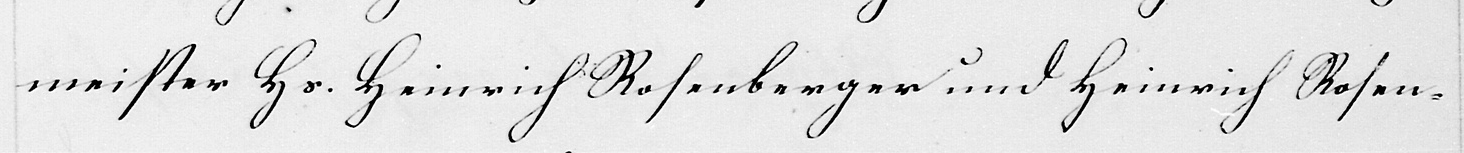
meister Hs. Heinrich Rosenberger und Heinrich Rosen¬
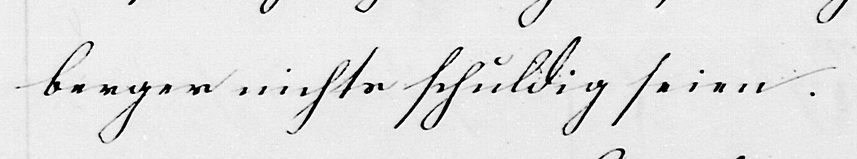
berger nichts schuldig seien.
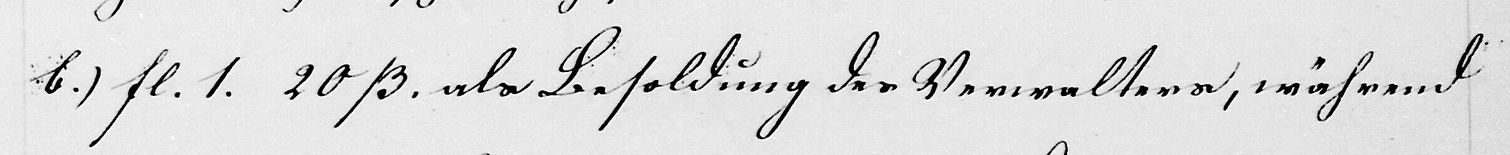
b.) fl. 1. 20 ß. als Besoldung des Verwalters, während
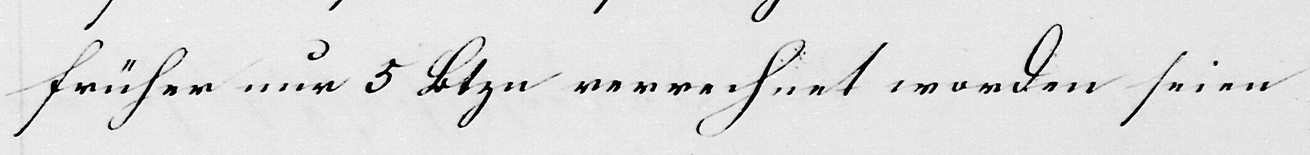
früher nur 5 Btzn verrechnet worden seien
